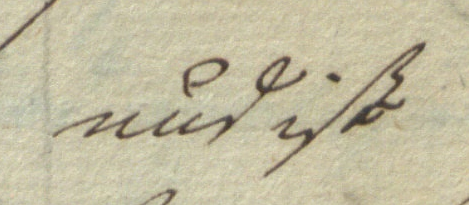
und ist
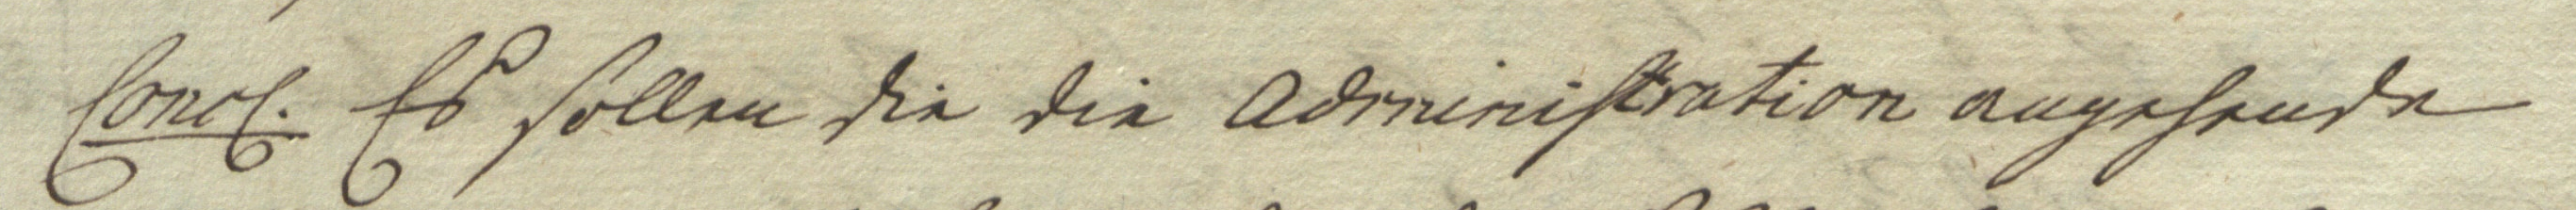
Concl. Es sollen die die Administration angehende
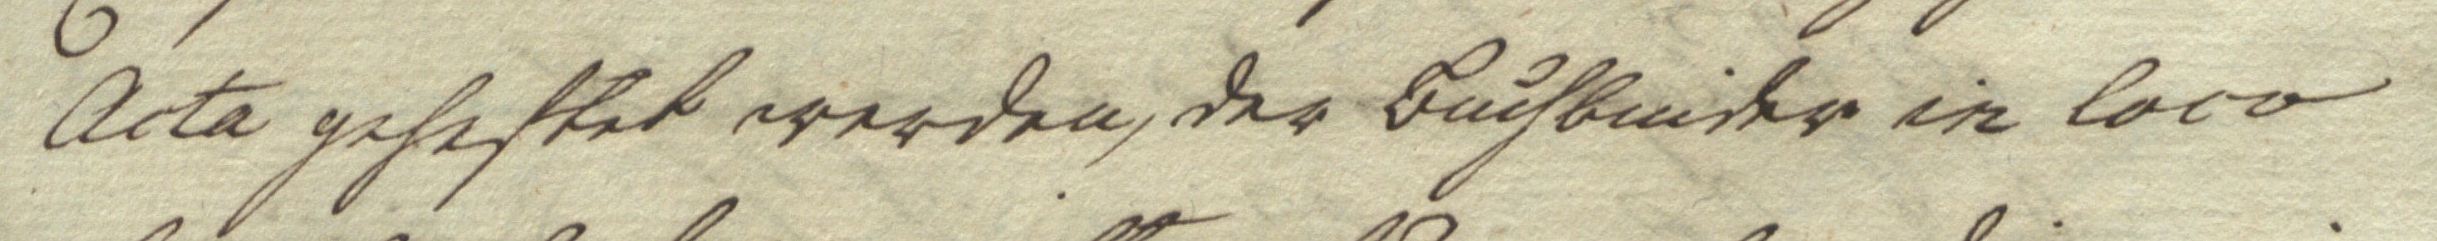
Acta geheftet werden, der Buchbinder in loco
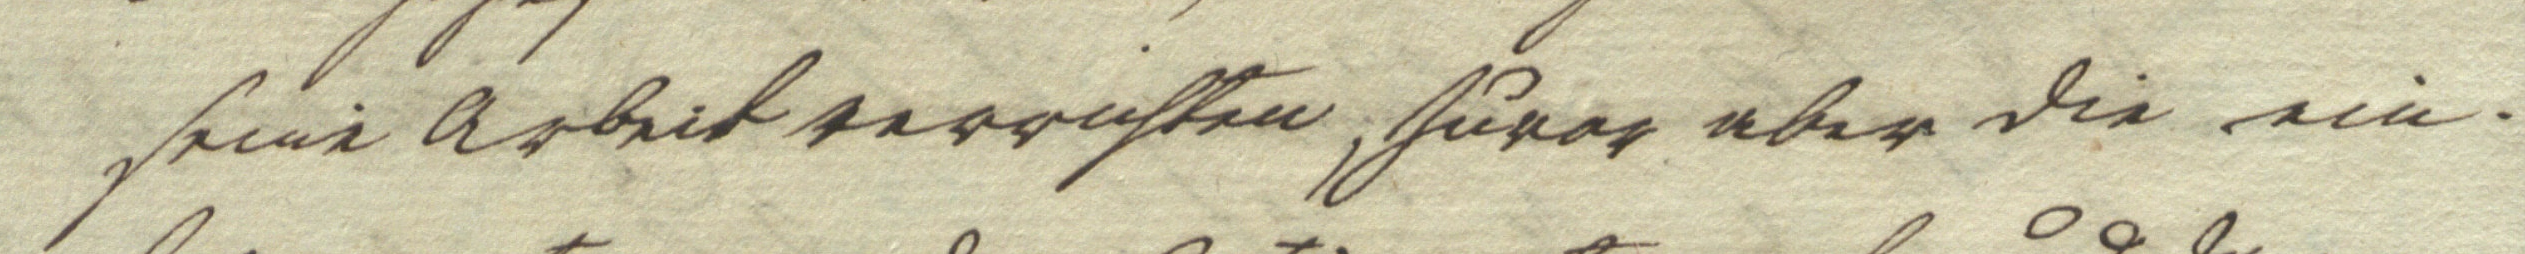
seine Arbeit verrichten, zuvor aber die ein¬
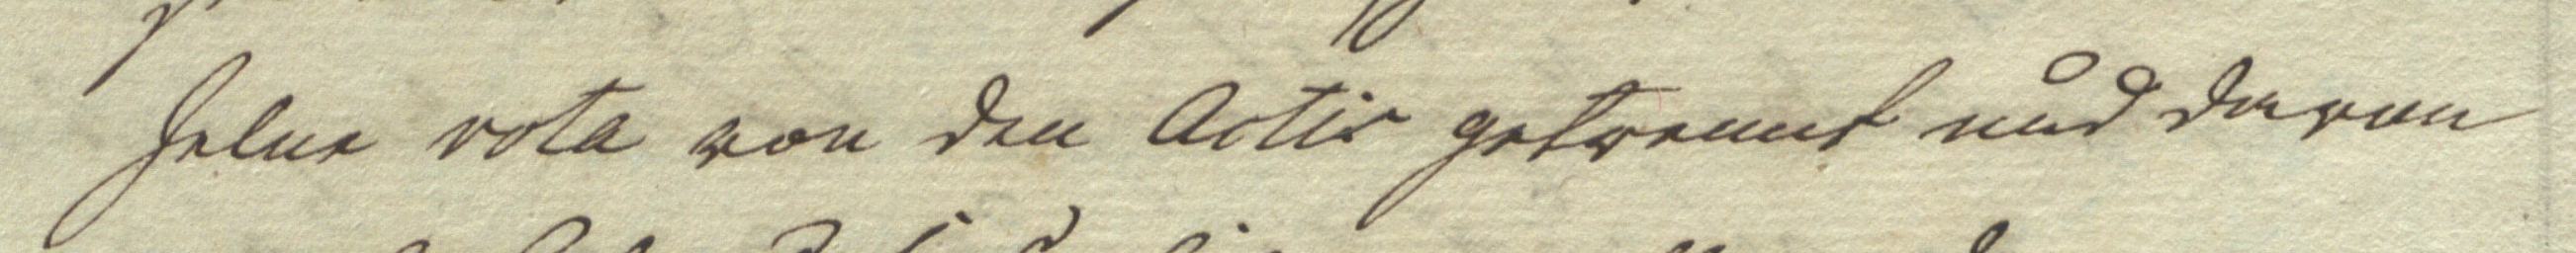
zelne vota von den Actis getrennt und davon
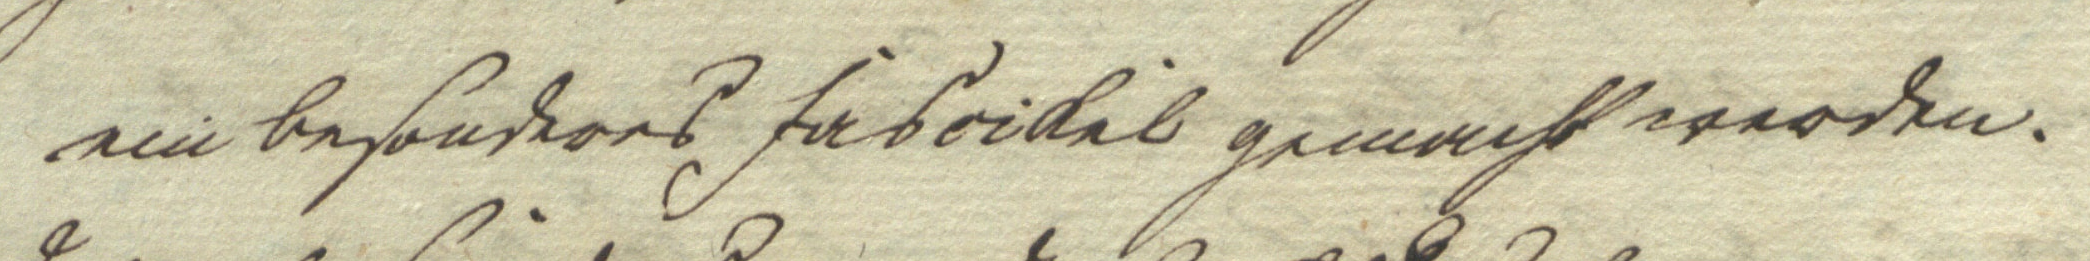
ein besonders Fascikel gemacht werden.
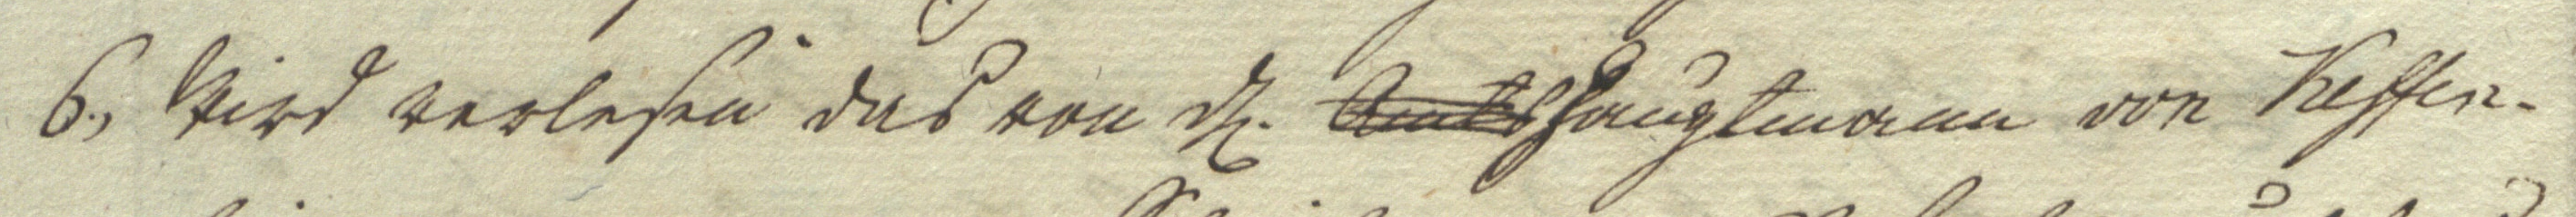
6., Wird verlesen das von dh. Ambts Hauptmann von Keffen¬
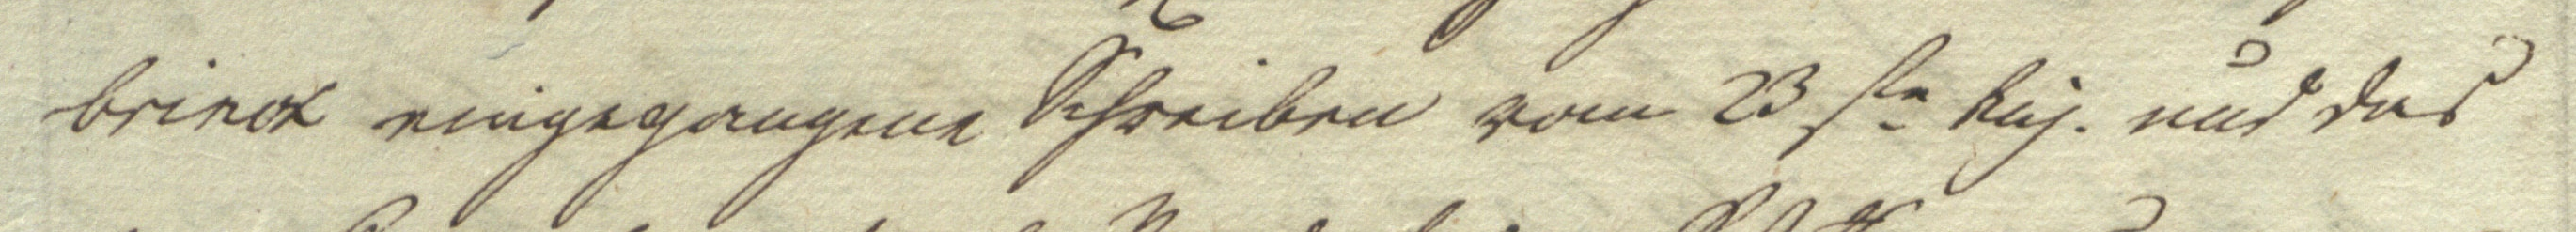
brinck eingegangene Schreiben vom 23sten huj. und das
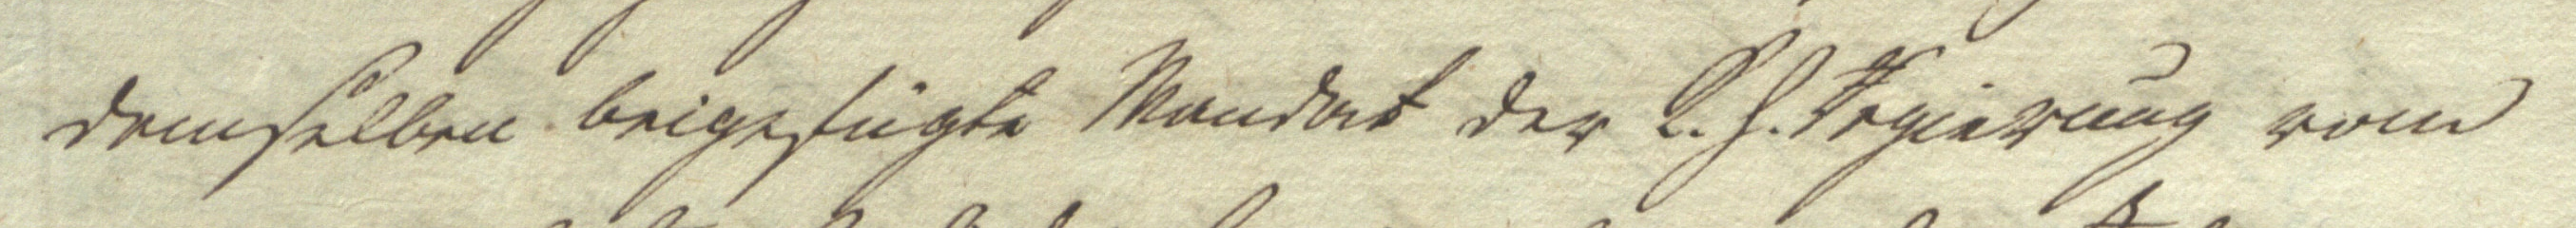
demselben beigefügte Mandat der K. H. Regierung vom
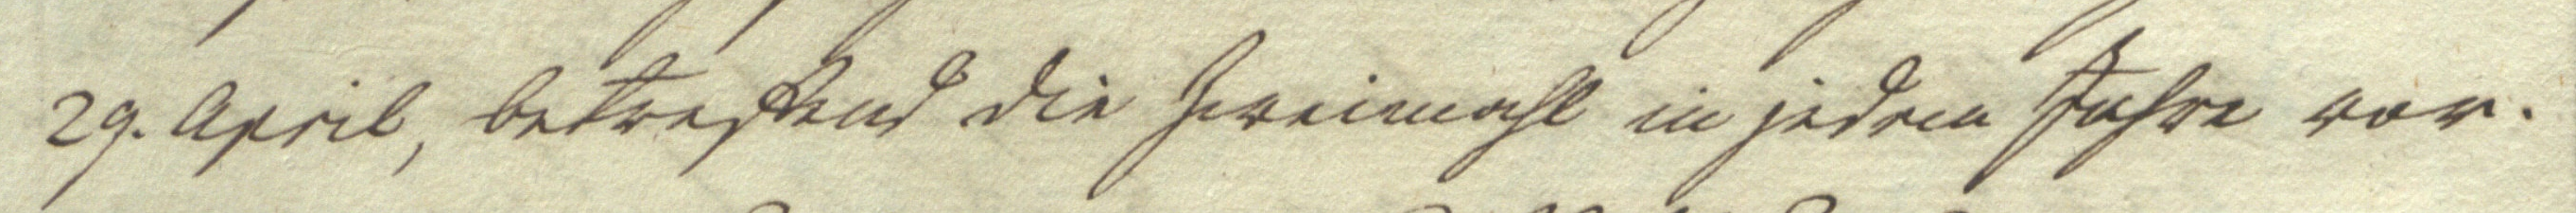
29. April, betreffend die Zweimahl in jedem Jahre vor¬
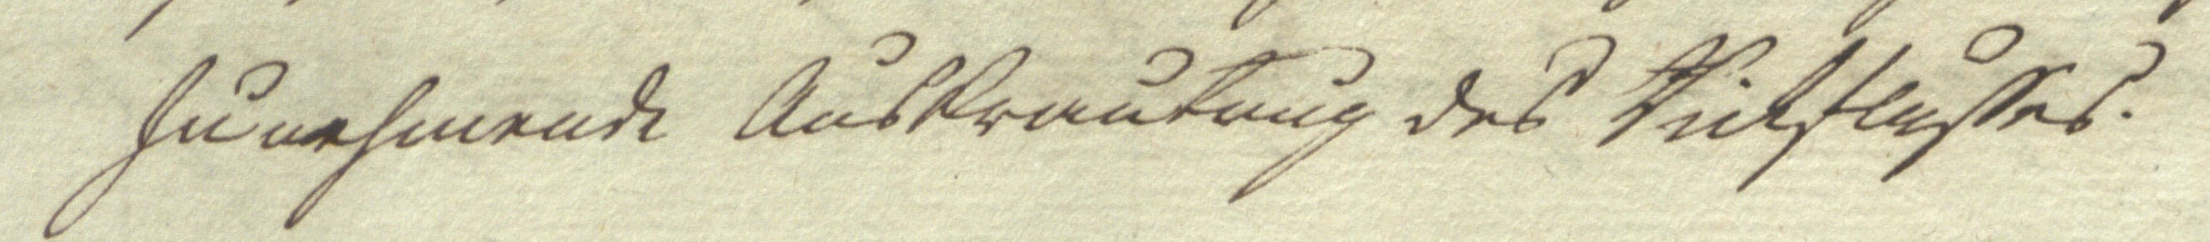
zunehmende Auskrautung des Rickflusses.
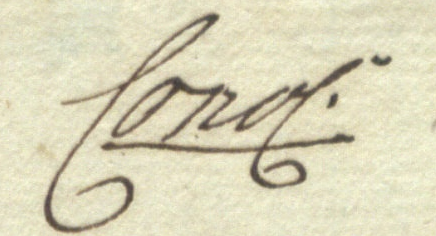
Concl.
